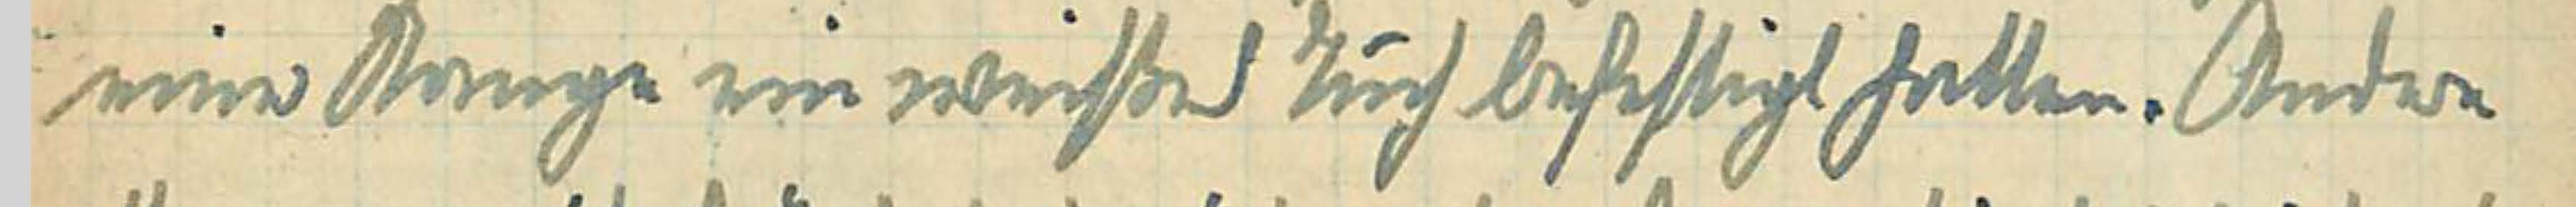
einer Stange ein weißes Tuch befestigt hatten. Andere
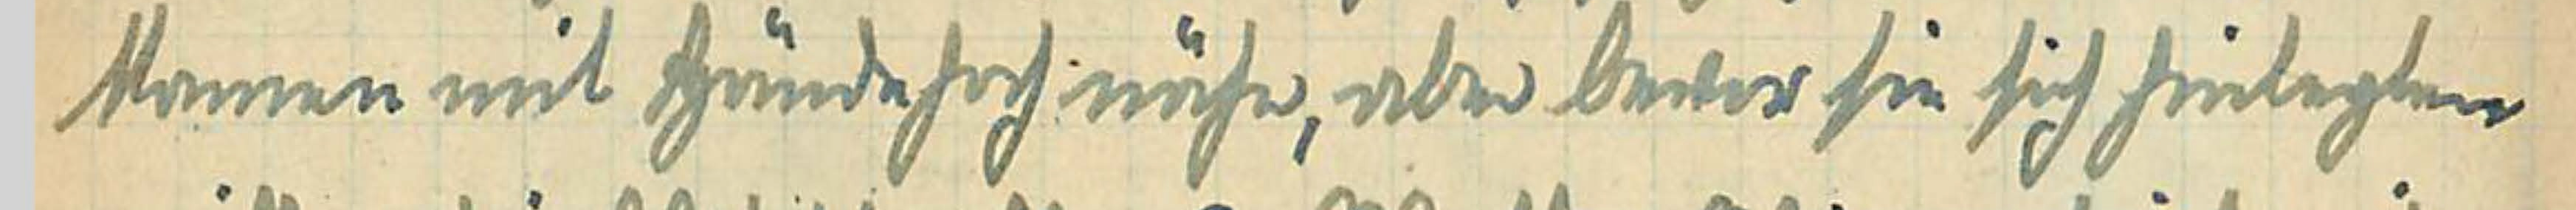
kamen mit Händehoch näher, aber bevor sie sich hinlegten
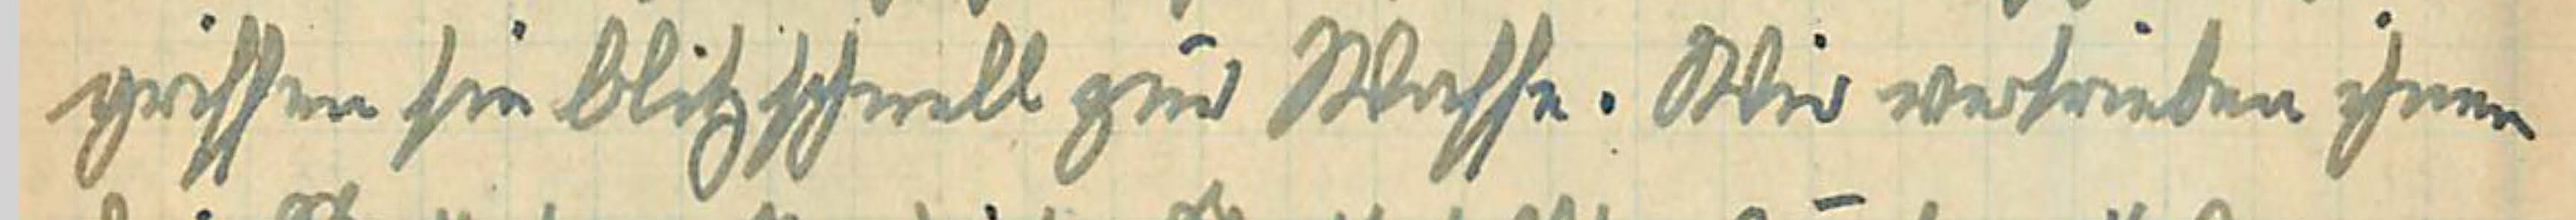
griffen sie blitzschnell zur Waffe. Wir vertrieben ihnen
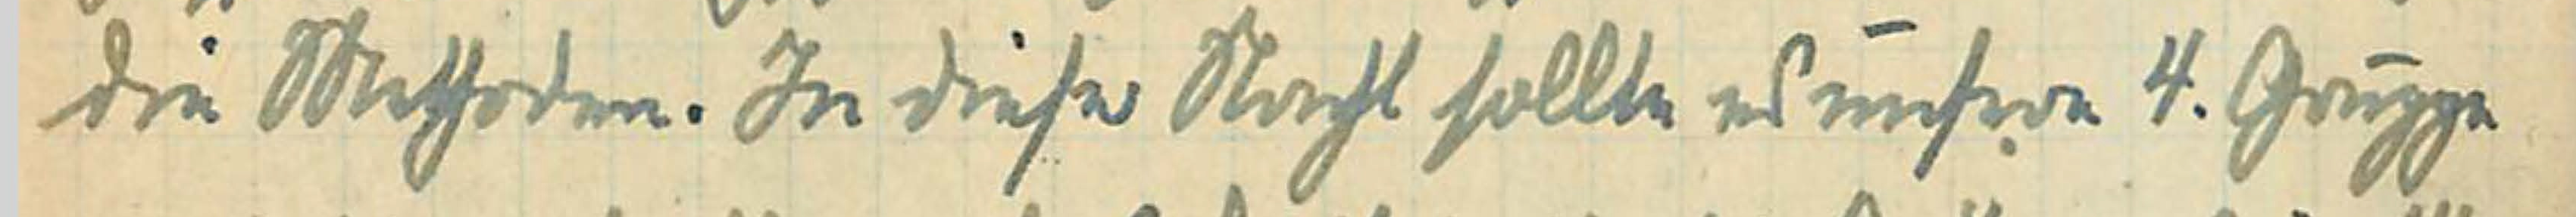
die Methoden. In dieser Nacht sollte es unsere 4. Gruppe
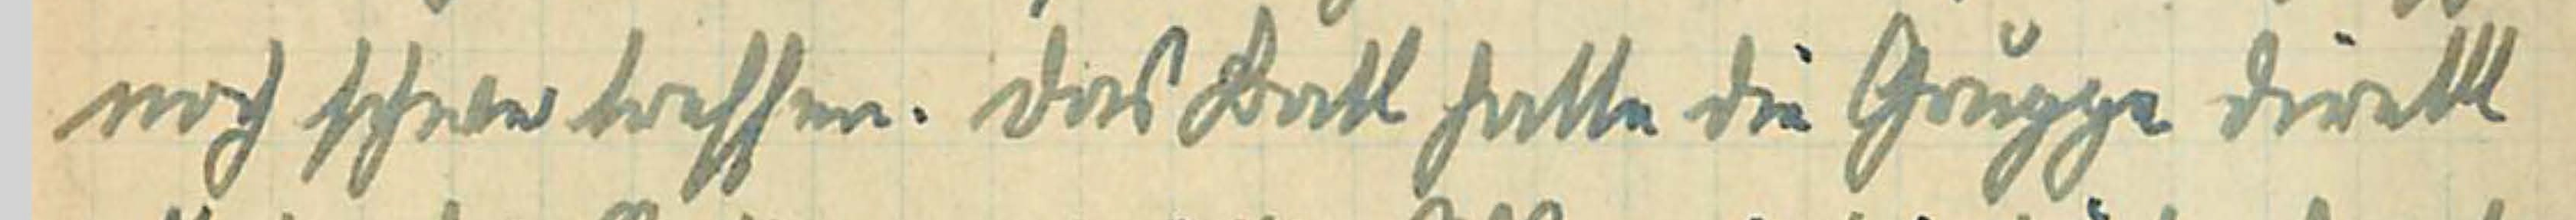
noch schwer treffen. Das Batl hatte die Gruppe direkt
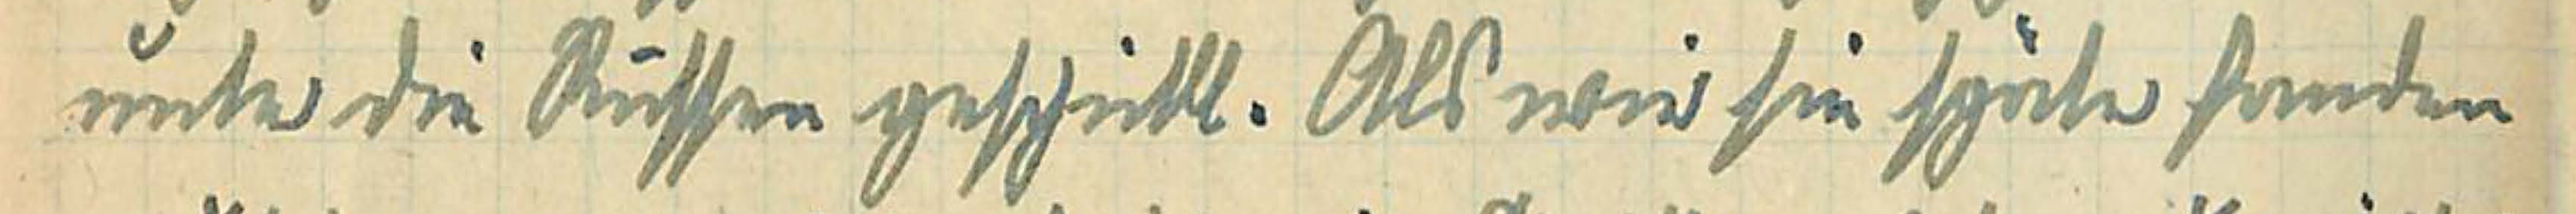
unter die Russen geschickt. Als wir sie später fanden
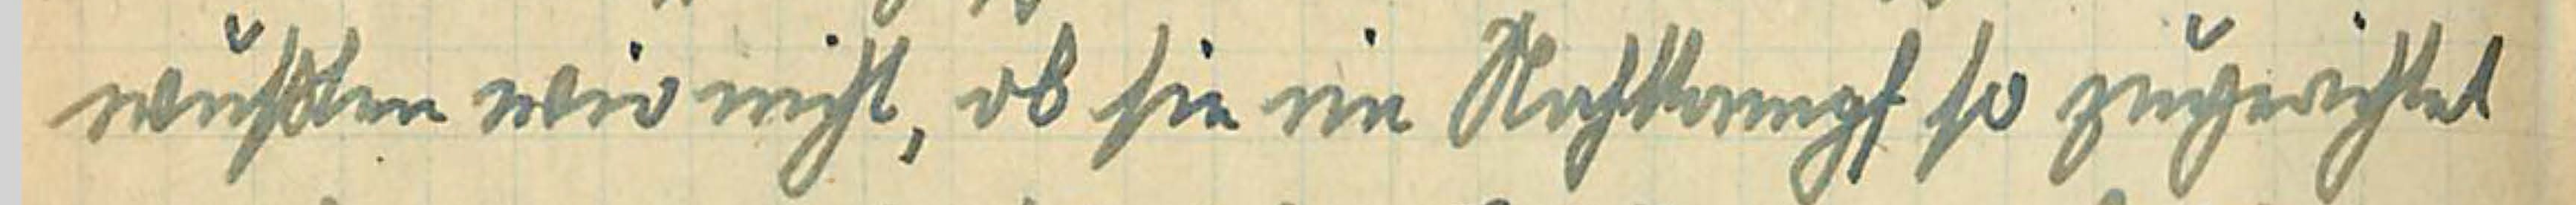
wußten wir nicht, ob sie im Nachtkampf so zugerichtet
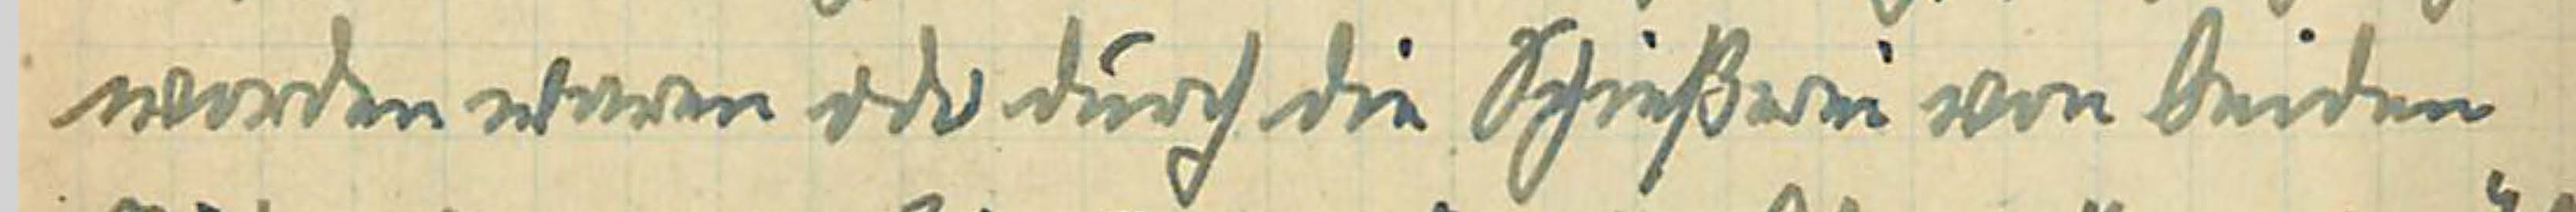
worden waren oder durch die Schießerei von beiden
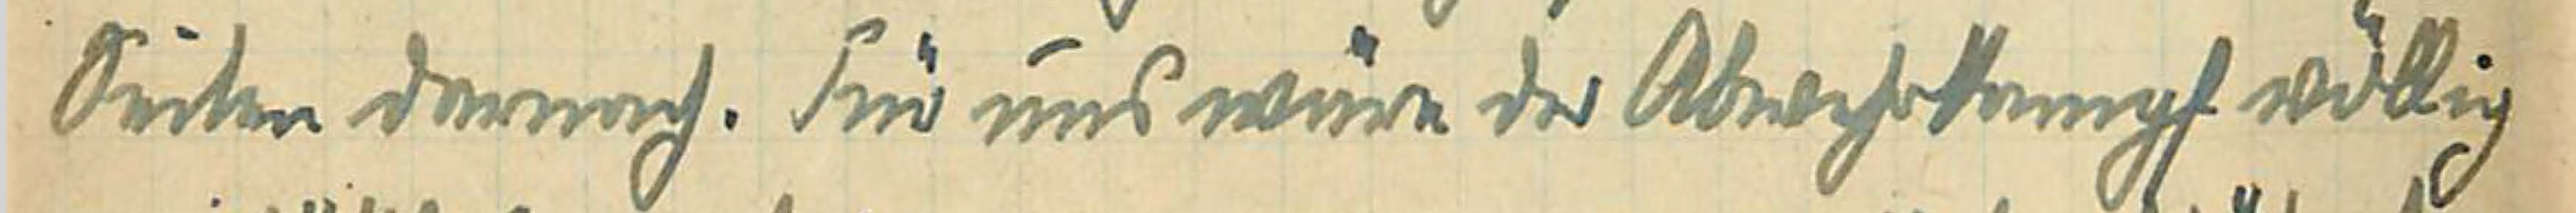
Seiten darnach. Für uns wäre der Abwehrkampf völlig
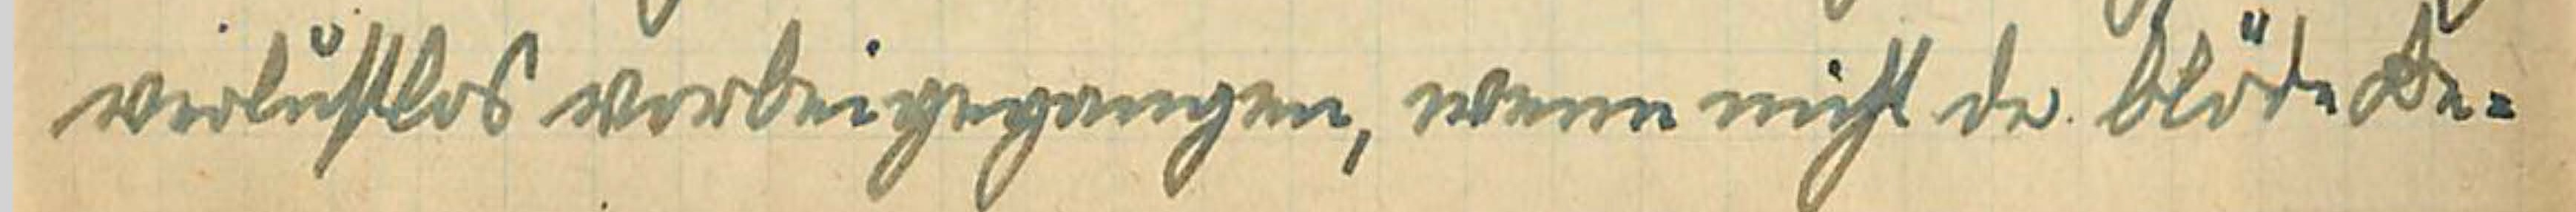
verlustlos vorbeigegangen, wenn nicht der blöde Be-
